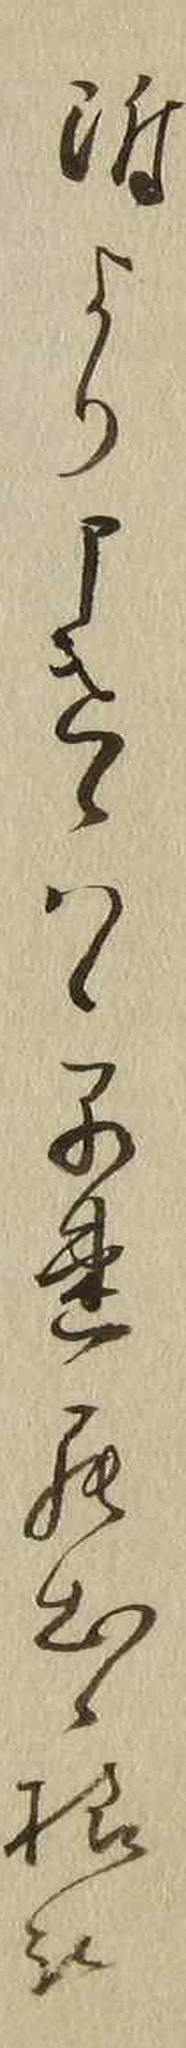附より申遣候ハヽ早速罷出候様被
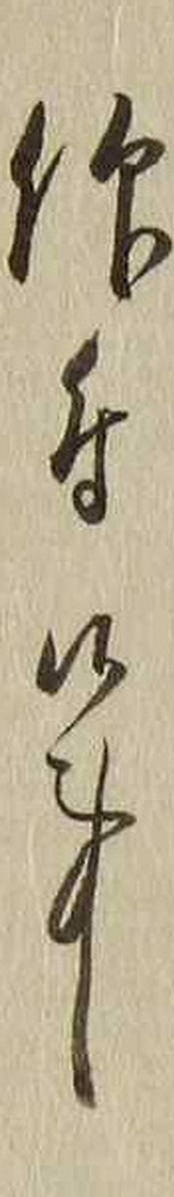仰付候事
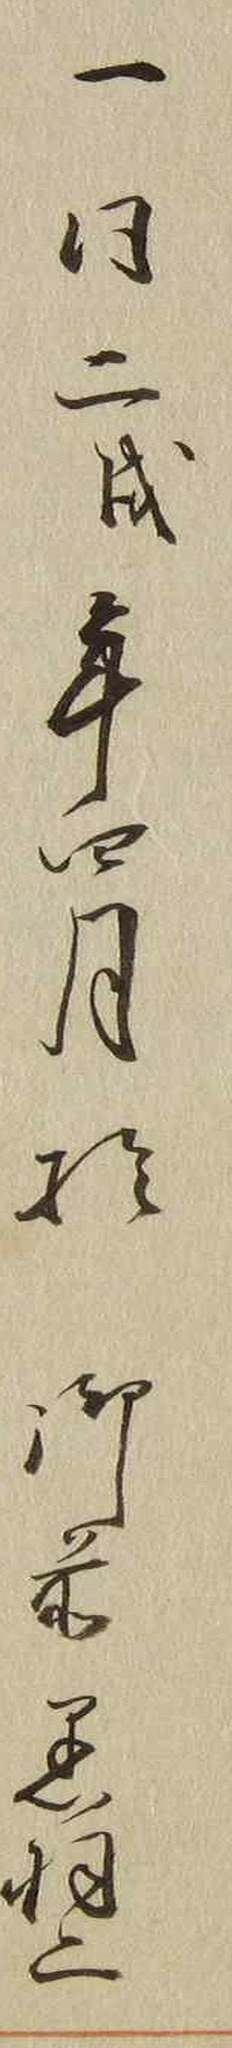一同二戌年四月於御前黒羽二
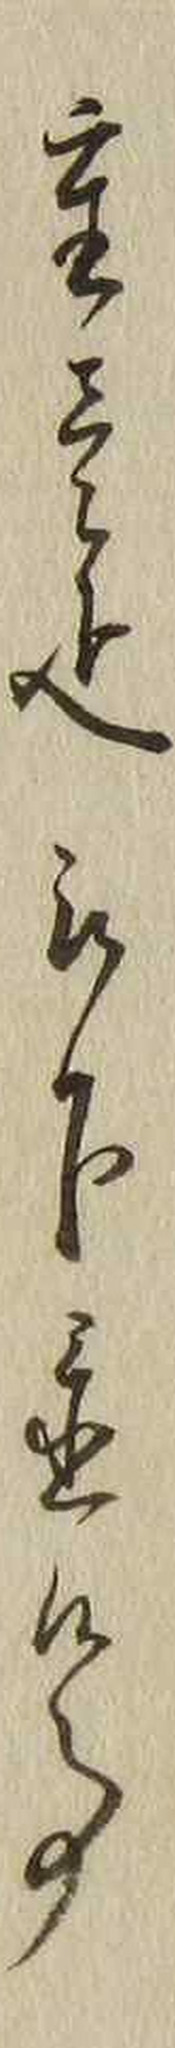重壱疋被下置候事
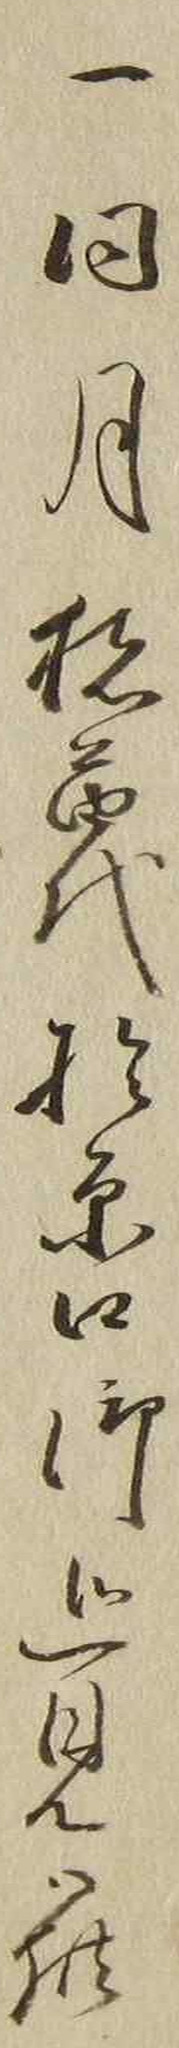一同月猪苗代於原口御巡見御供
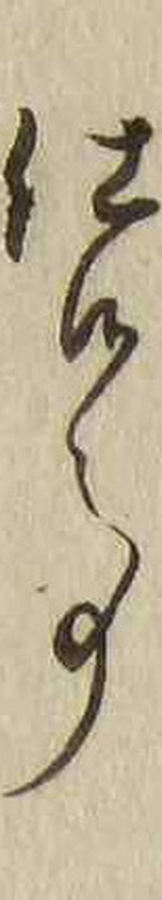仕候事
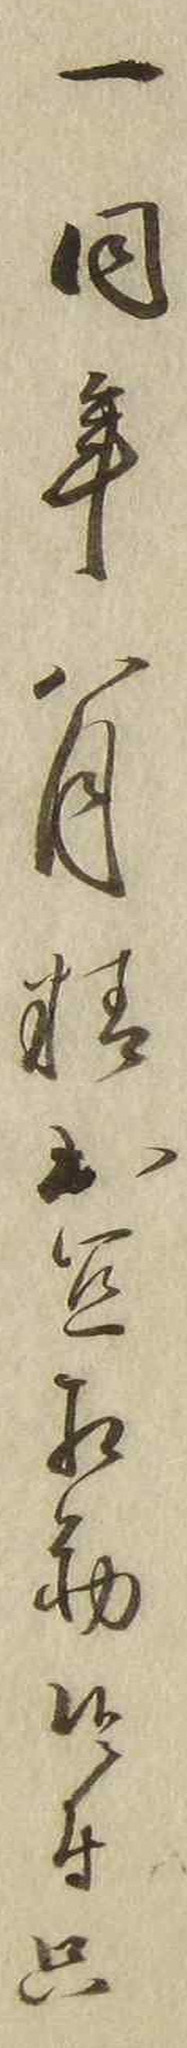一同年八月精出宜相勤候ニ付只

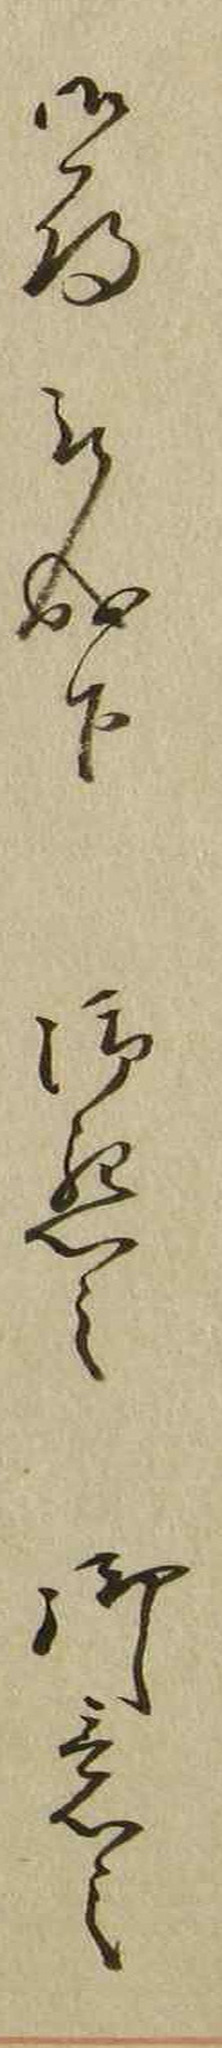御尋被成下御懇之御意之
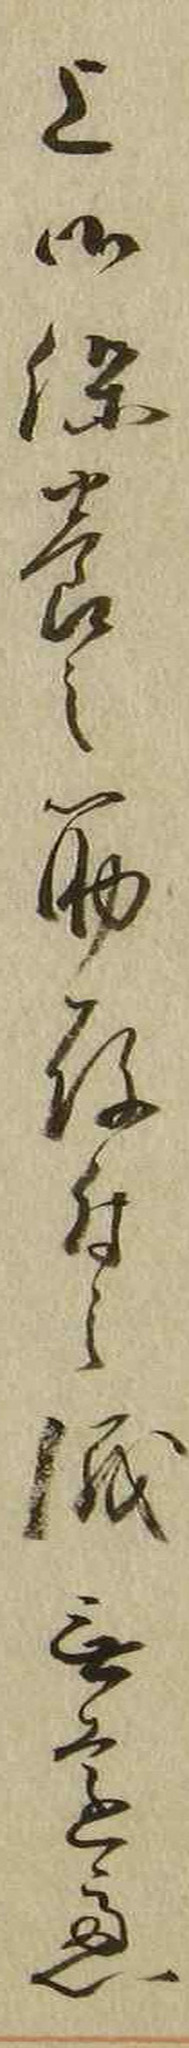上御保養之筋存付之儀無遠慮
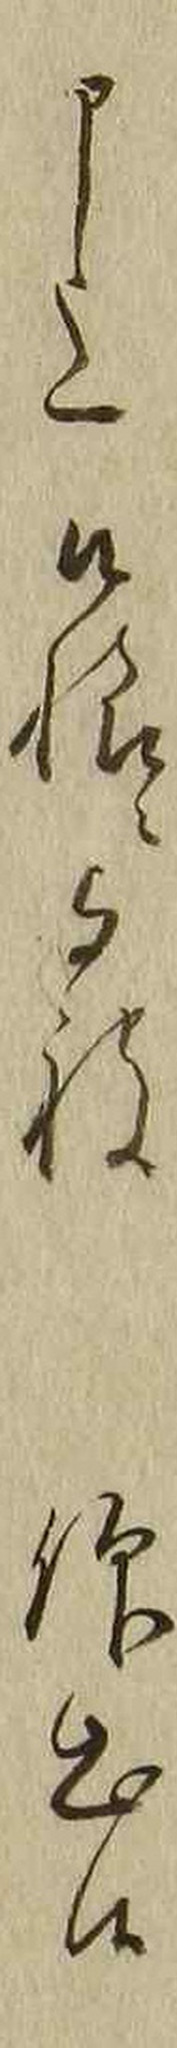申上候様ニ与被仰出候
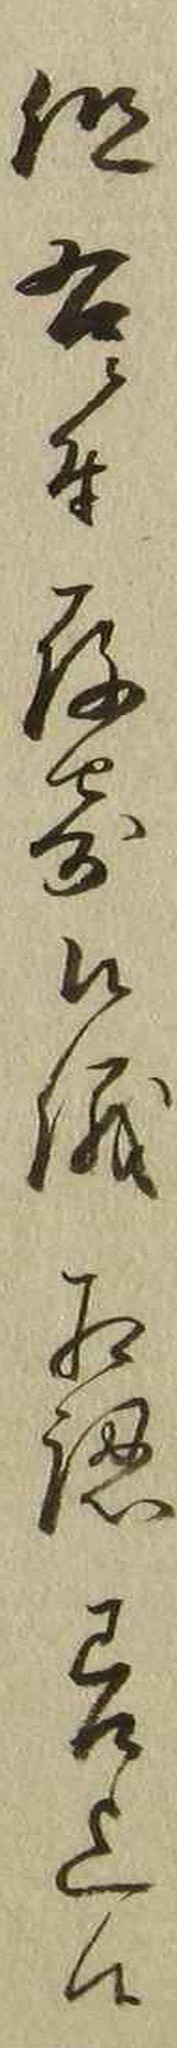但右ニ付存寄候儀相認差上候
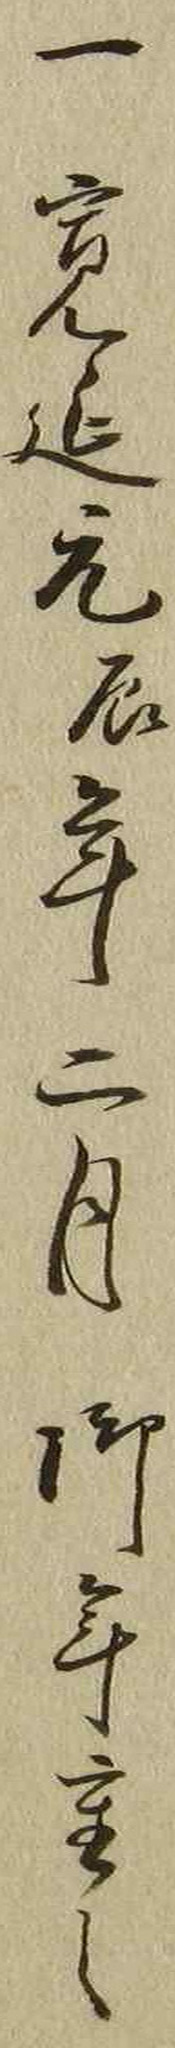一寛永元辰年二月御年重之
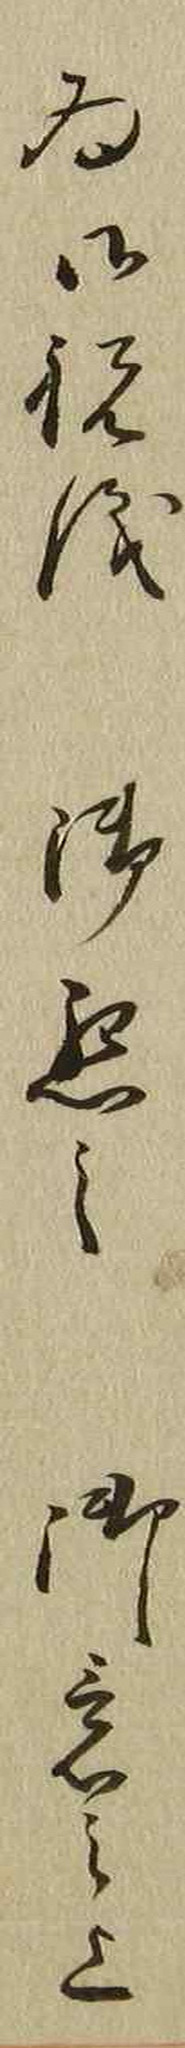為御祝儀御懇之御意之上
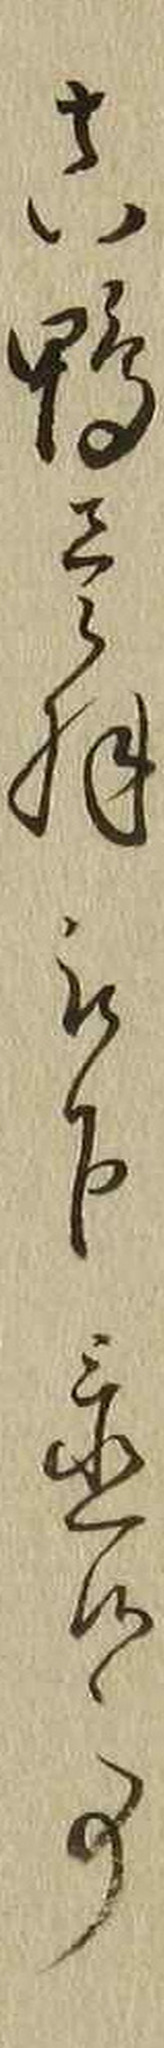真鴨壱羽被下置候事
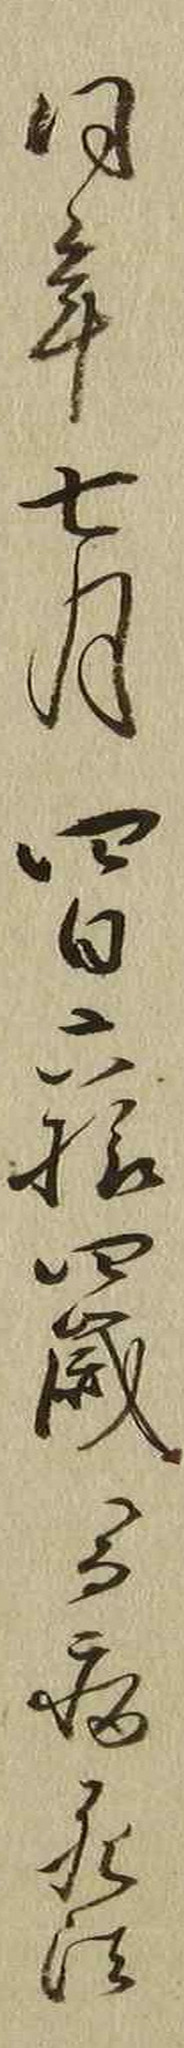一同年七月四日六拾四歳ニ而病死法
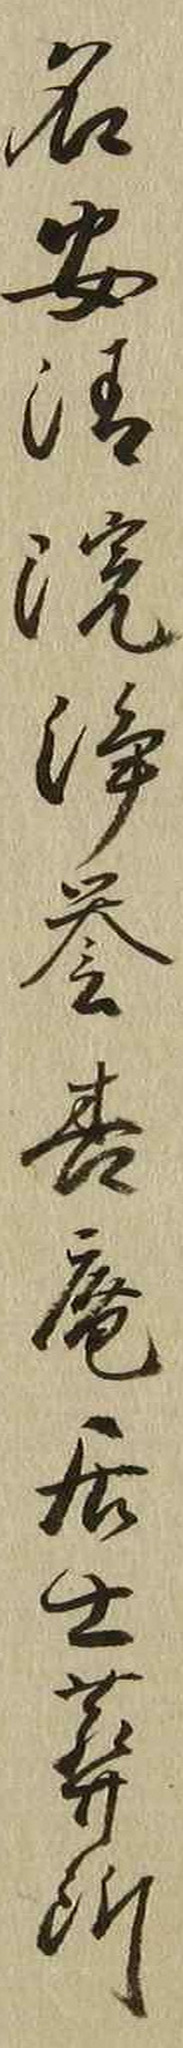名安清院浄誉杏庵居士葬所
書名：諸士系譜　巻之68　を之部2
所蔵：会津若松市立会津図書館
